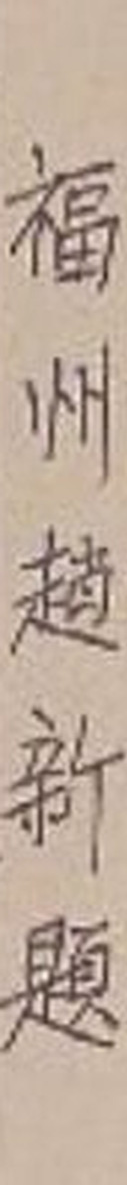福州趙新題
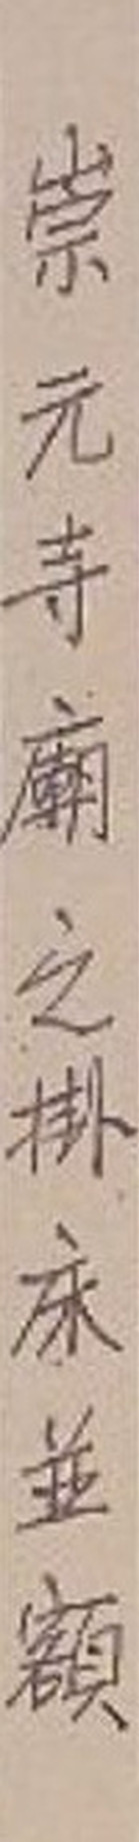崇元寺廟之掛床並額
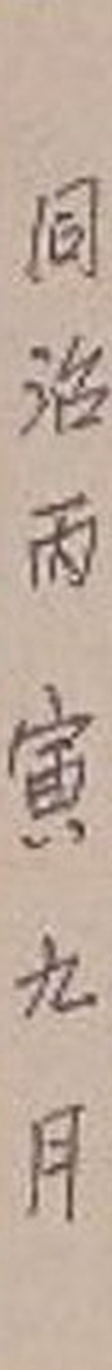同治丙寅秋九月
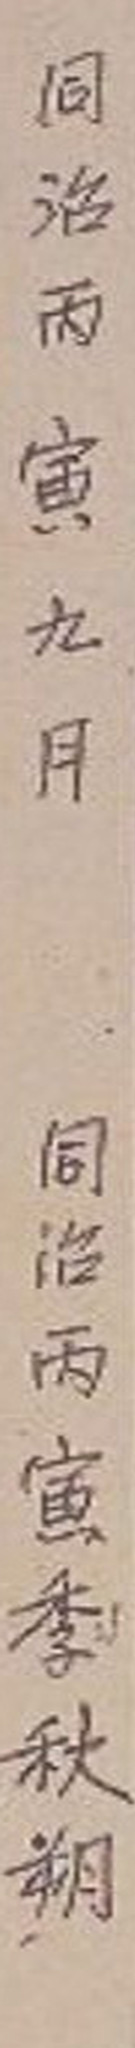同治丙寅九月同治丙寅季秋朔
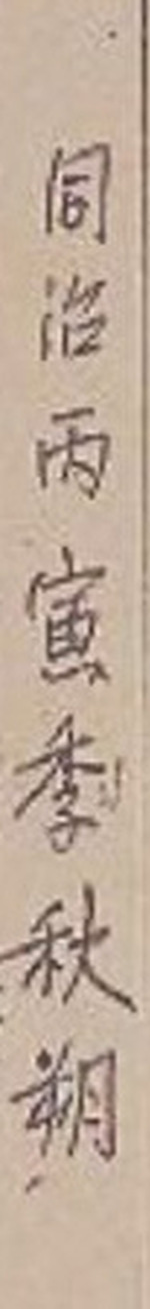同治丙寅季秋

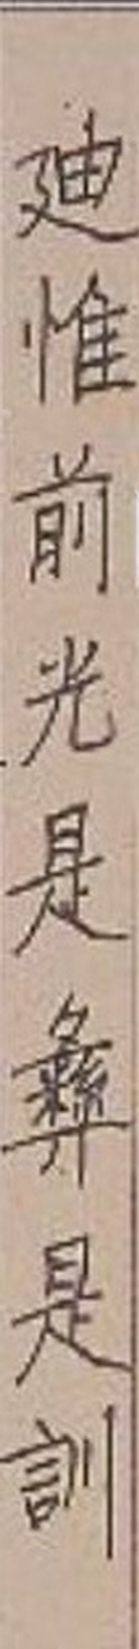廸惟前光是彝是訓明
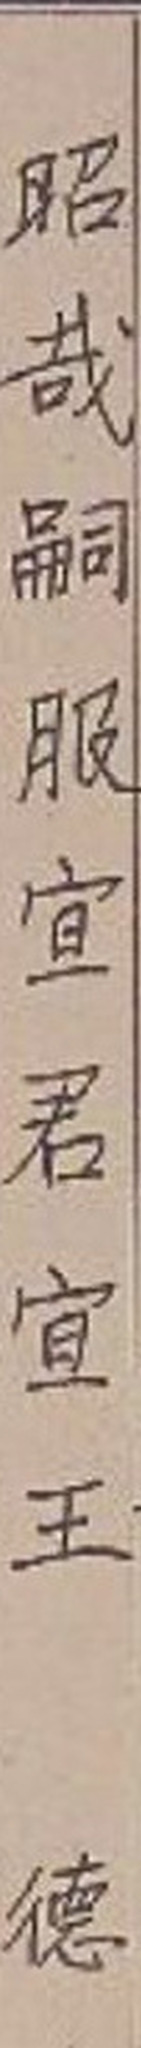昭哉嗣服宜君宜王徳
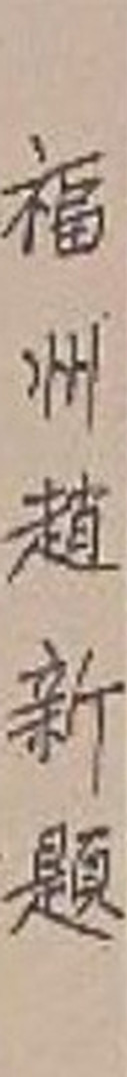福州趙新題
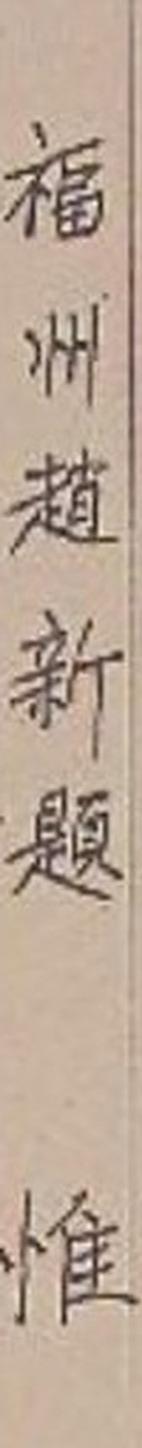福州趙新題惟
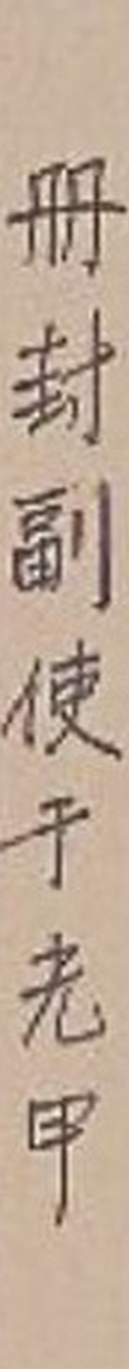冊封副使干光甲
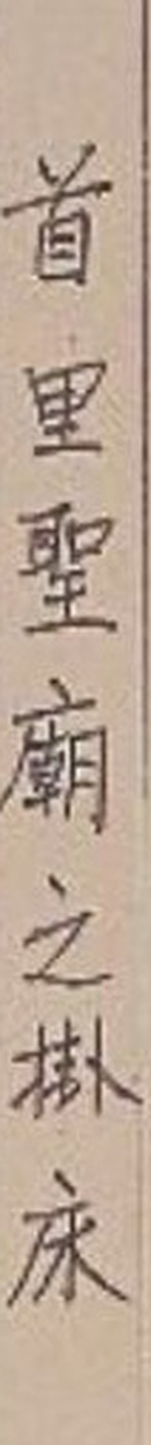首里聖廟之掛床
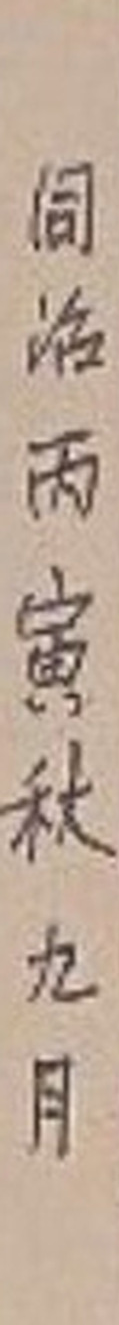同治丙寅秋九月
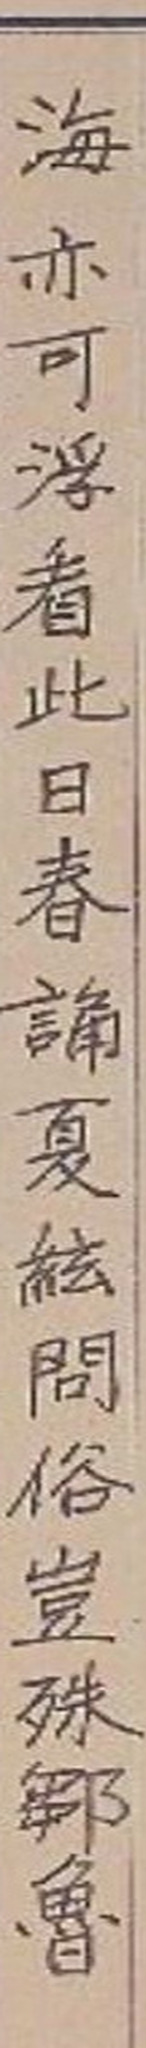海亦可浮看此日春誦夏絃問俗豈殊鄒魯
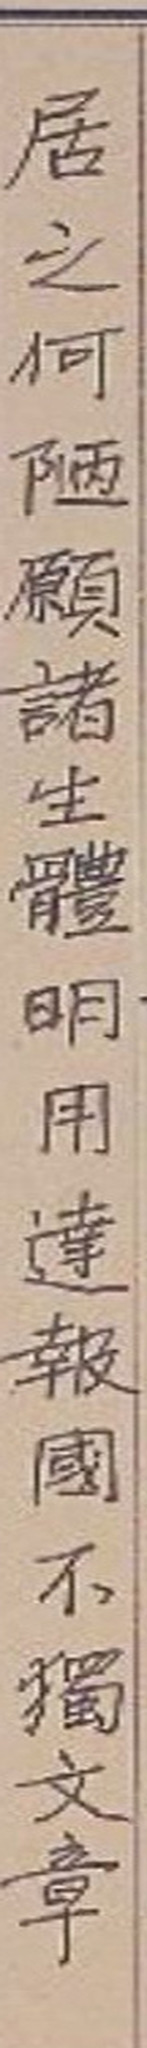居之何陋願諸生体明用達報国不独文章
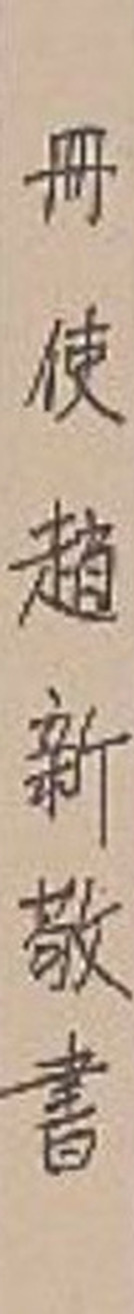冊使趙新敬書
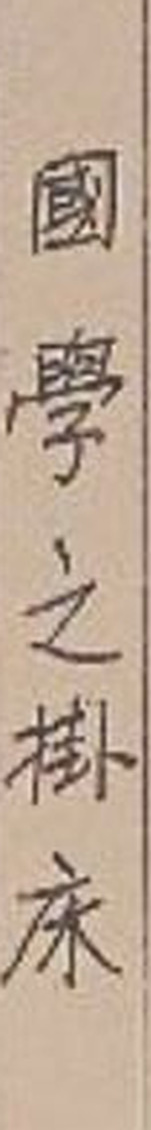国学之掛床
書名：支那冊封使来琉諸記 下巻
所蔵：University of the Ryukyus Library
